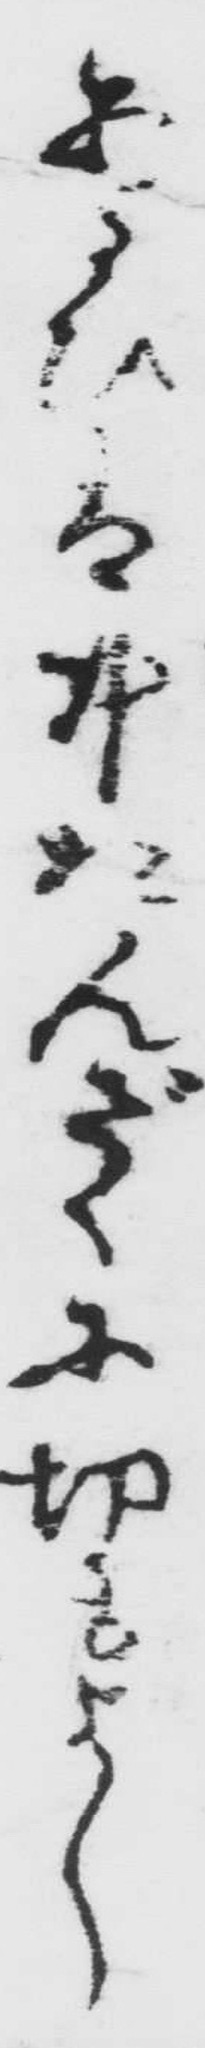あるひは中たんざくに切もよし
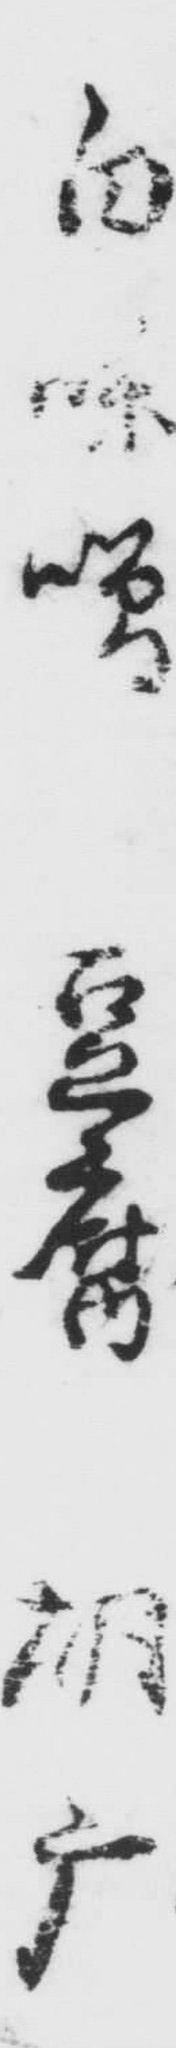白味噌豆腐胡麻
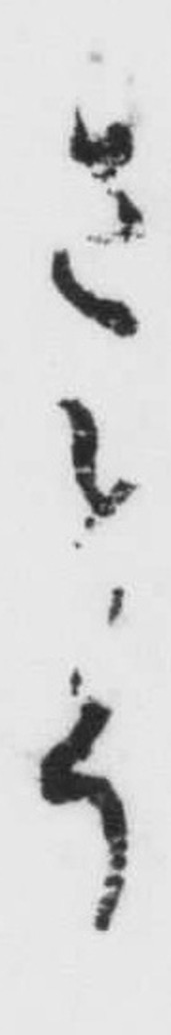さとう
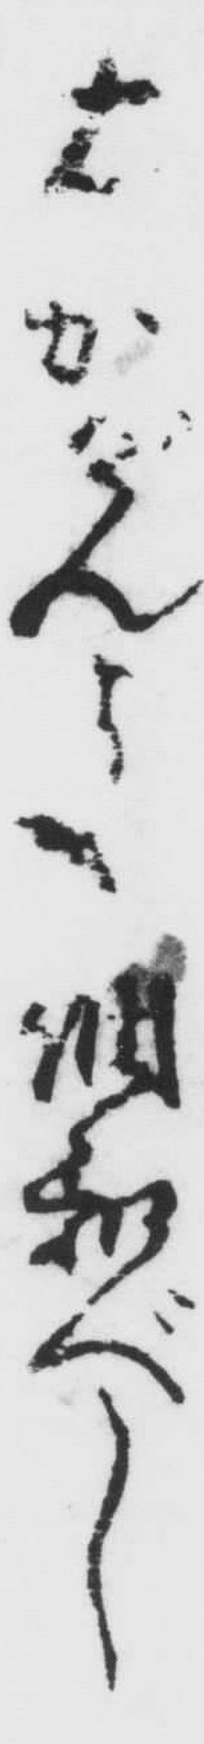右かげんよく調和べし
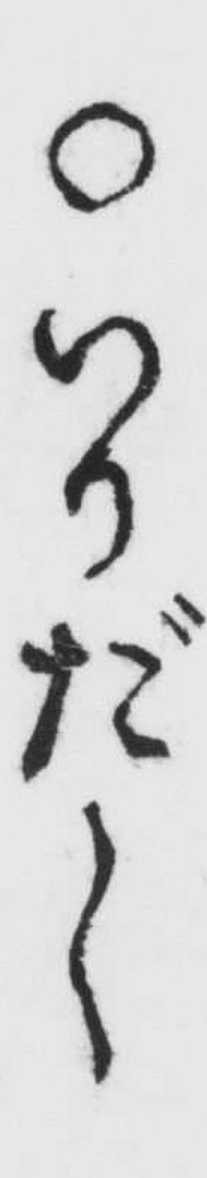○いりだし
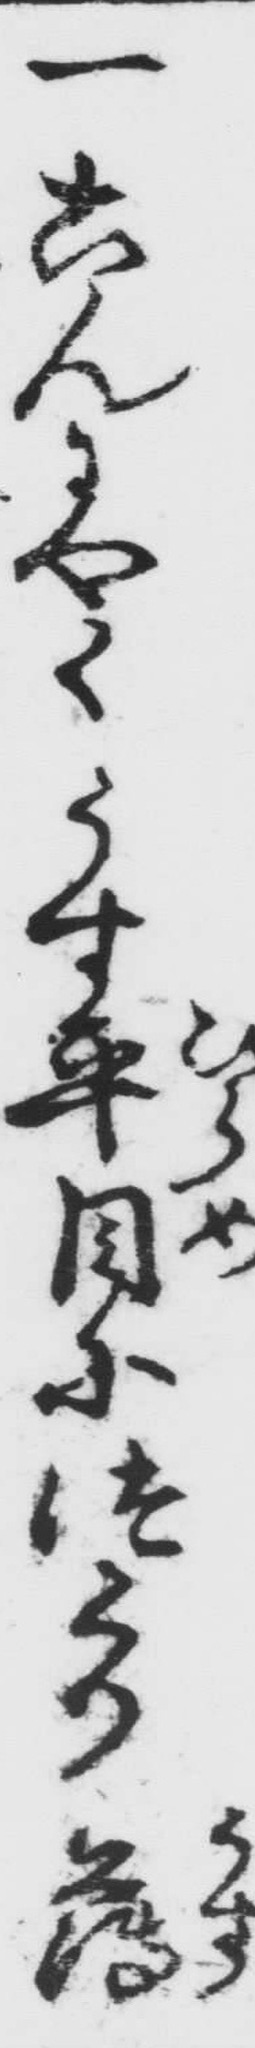一こんにやくうす平目につくり薄
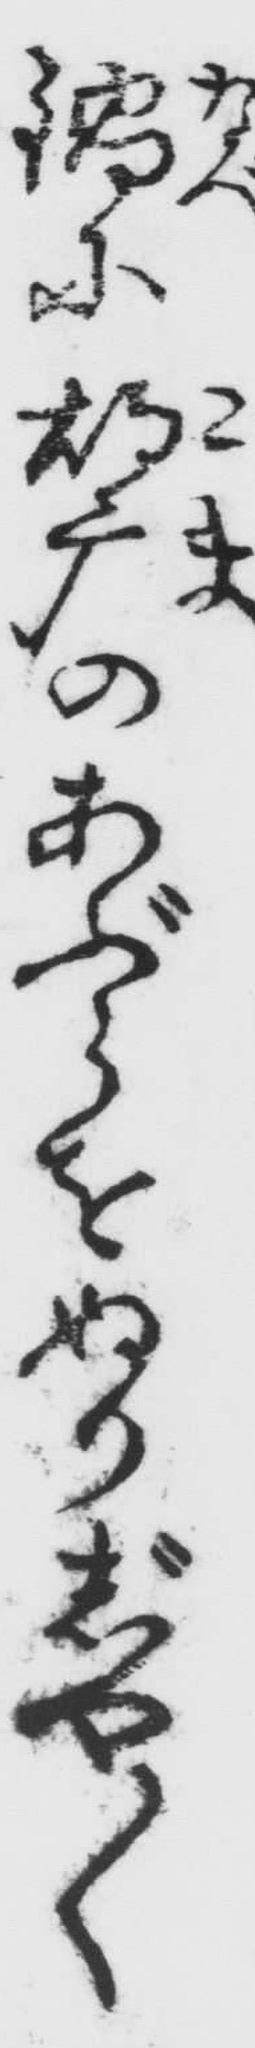鍋に胡麻のあぶらをぬりじや〳〵
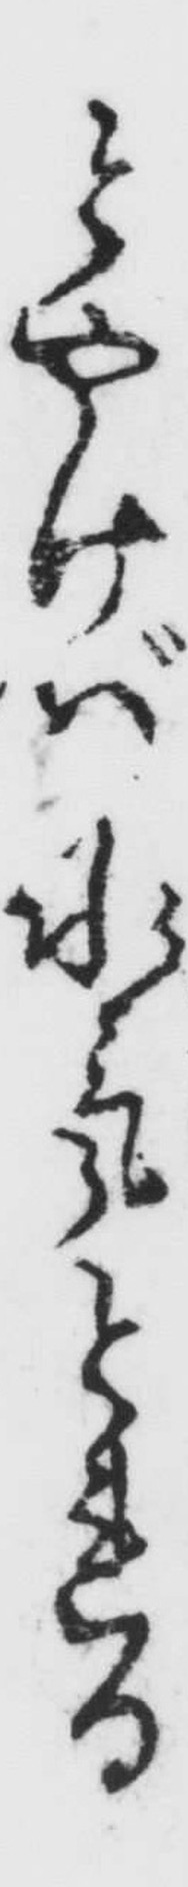とやけば水気とれる
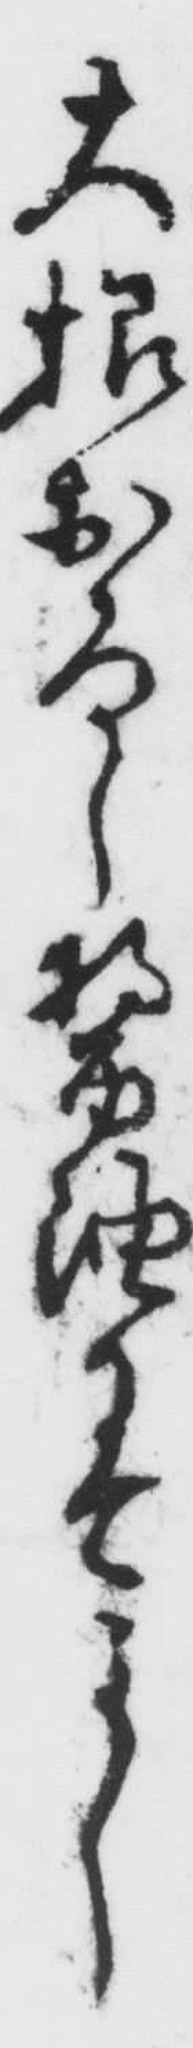大根おろし醤油にてよし
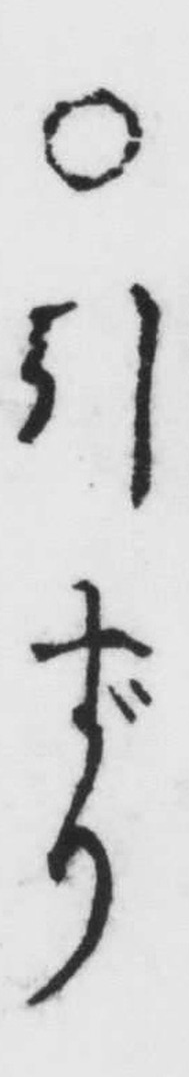○引ずり

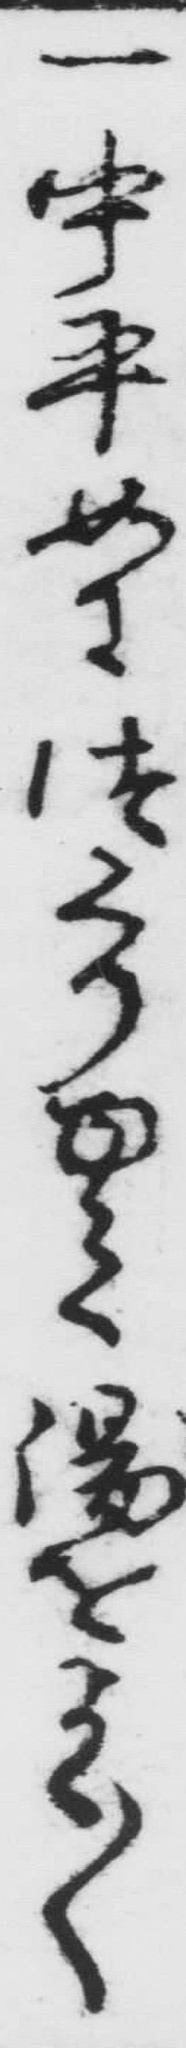一中平めにつくりゆて湯をよく〳〵
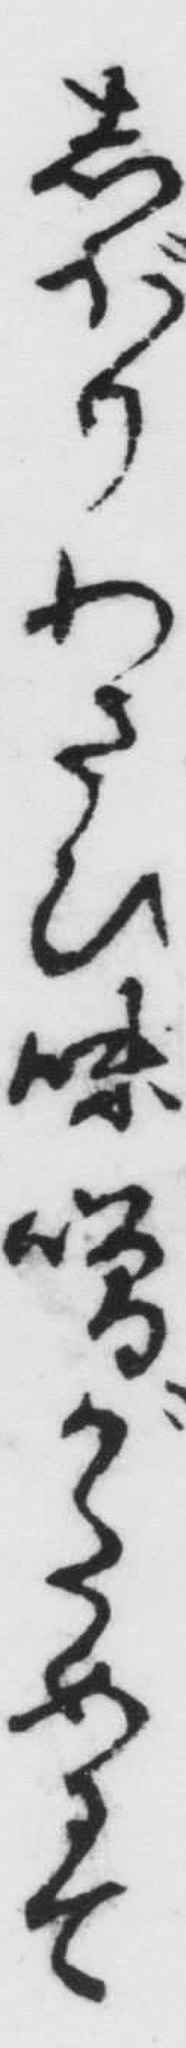しぼりわさひ味噌がためにて
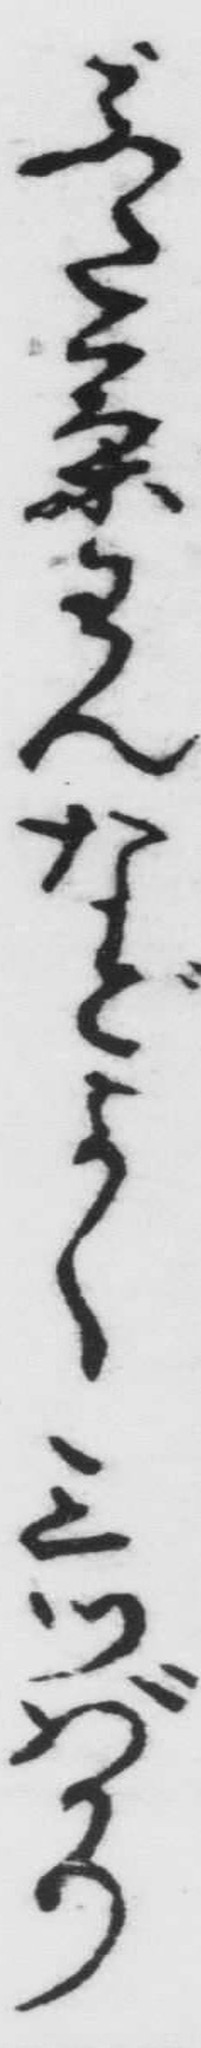ふた茶わんなどよく三つばかり
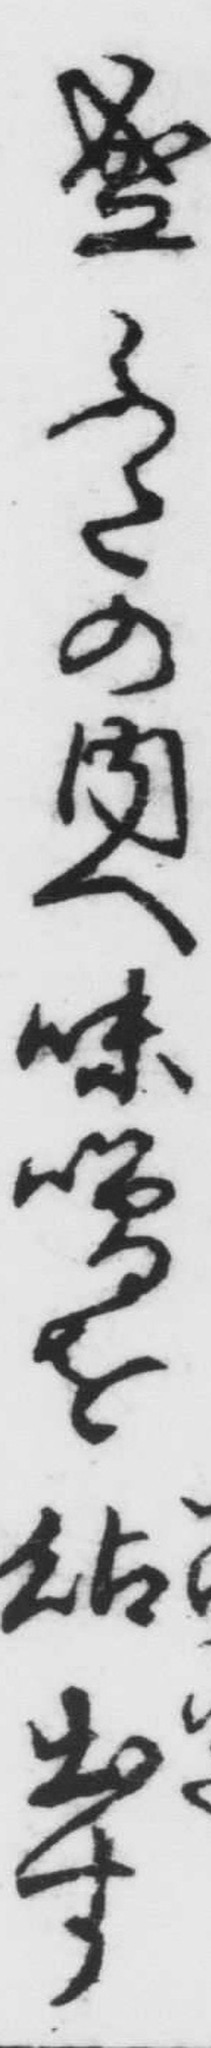盛ふたの内へ味噌を貼出す
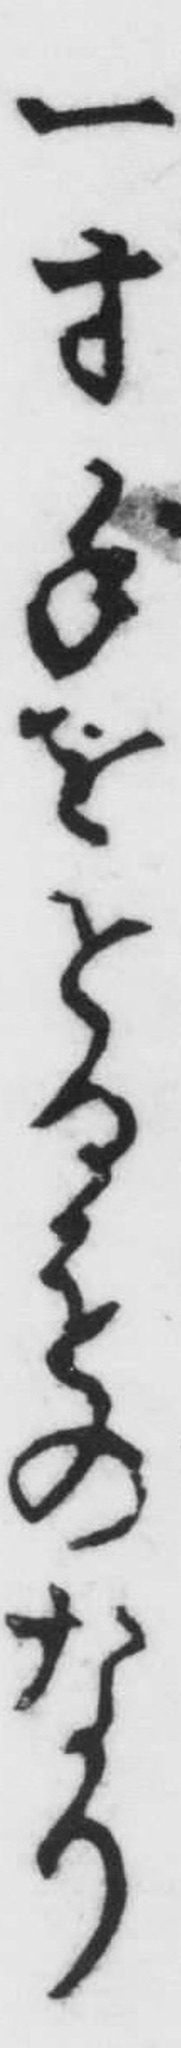一寸手をとるものなり
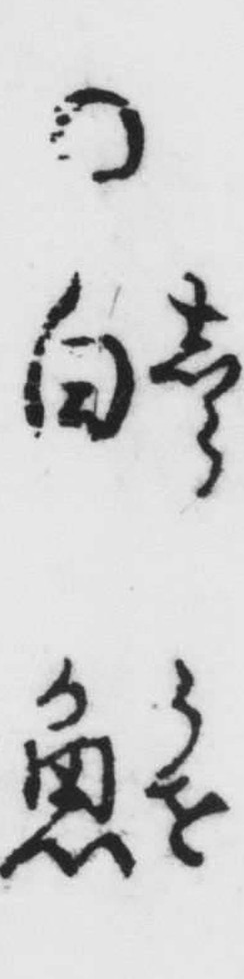○白魚
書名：蒟蒻百珍
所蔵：大阪府立大学学術情報センター 国文学研究資料館
